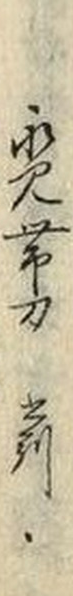永見帯刀書判
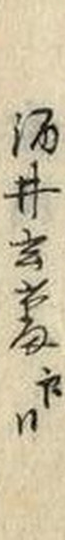酒井玄蕃印同
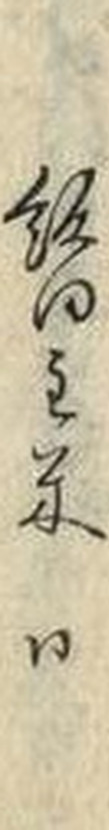飯田主米同
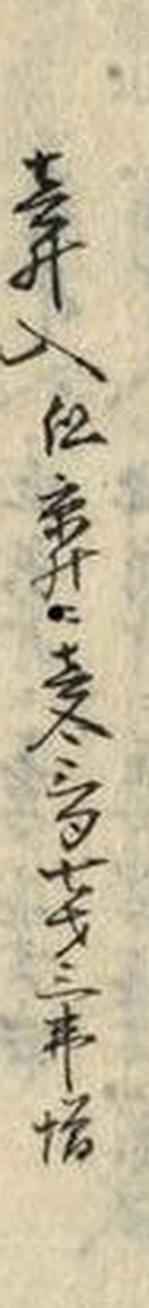一納升壱升入但京升ニ壱合三勺七才三弗増

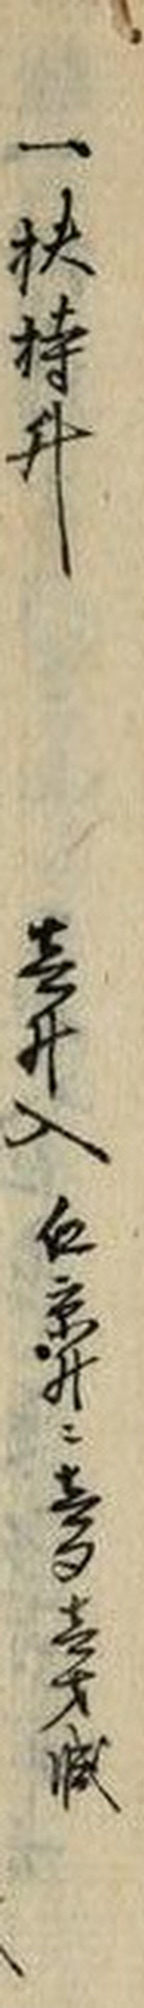一扶持升壱升入但京升ニ壱勺壱才減
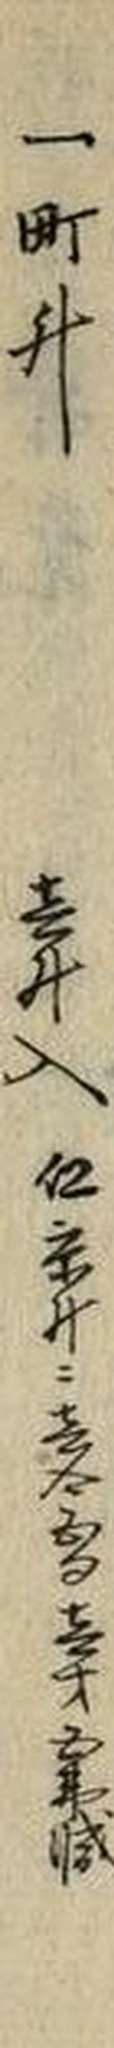一町升壱升入但京升ニ壱合五勺壱才五弗減
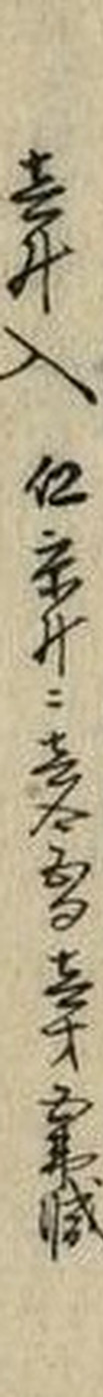一町升壱升入但京升ニ壱合五勺壱才五弗減
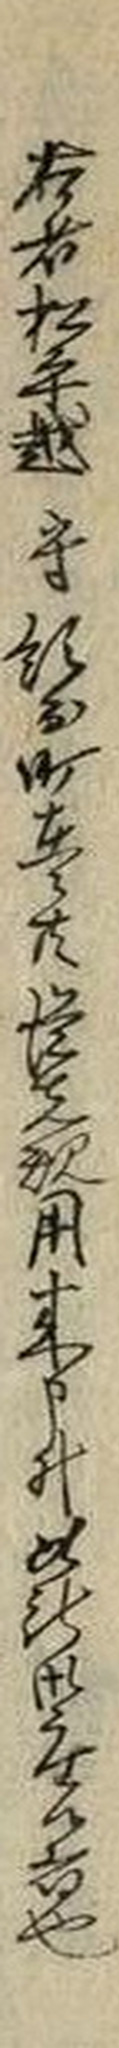右者松平越守領分町在々共従先規用来申升如此御座候者也
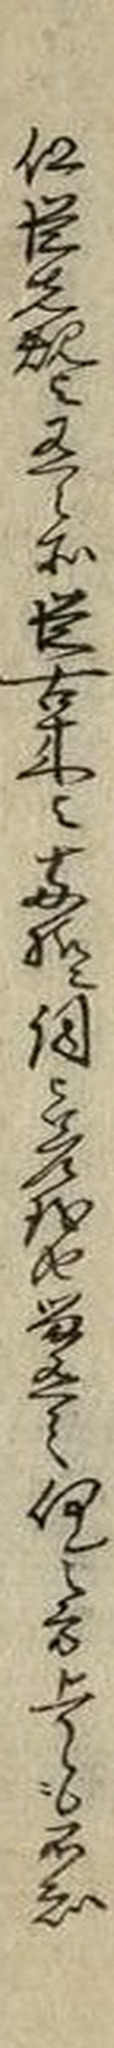但従先規与有之所従古来与両様ニ伺被差越由留有之何レ之方上り候も不知
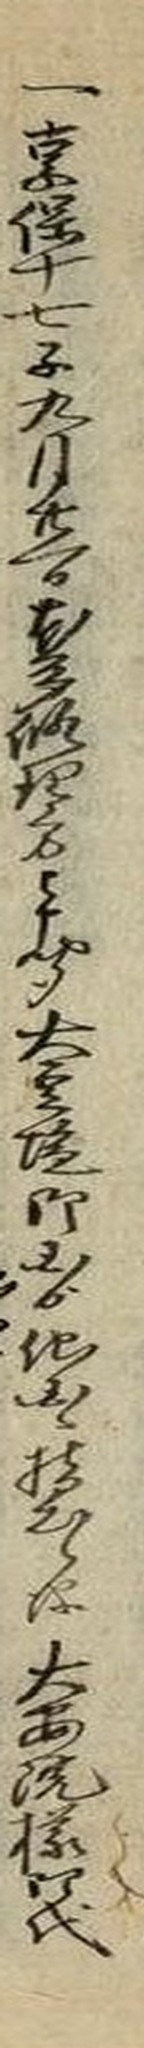一享保十七子九月廿一日本多修理方被申聞大豆塩御国ゟ他国へ指出候儀大安院様御代
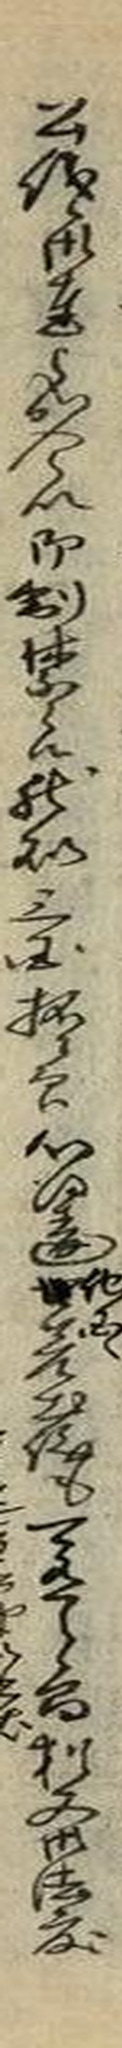公儀へ御達被成入候御制禁ニ候然処三国抔ニ而ハ心得違他国へ差出儀も可有之候間猶又御法度
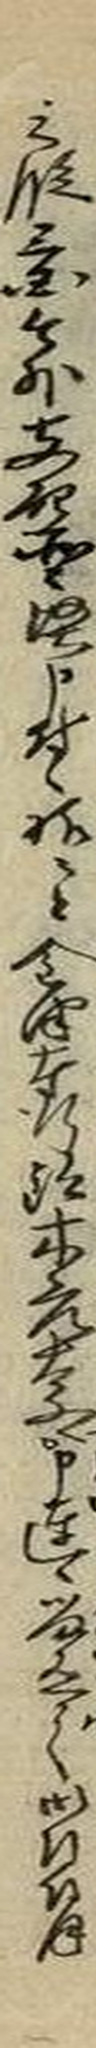之段三国其外支配所々堅申付候様ニと金津奉行鈴木彦太夫へ可申達旨被申聞以書状申達候留有之御目付月
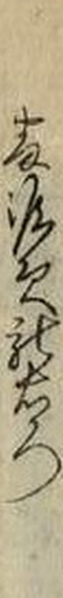番渥美新右衛門
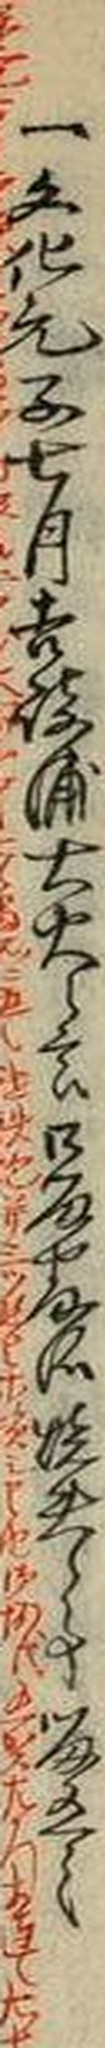一文化元子七月吉崎浦大火之節口留番所焼失之事留有之
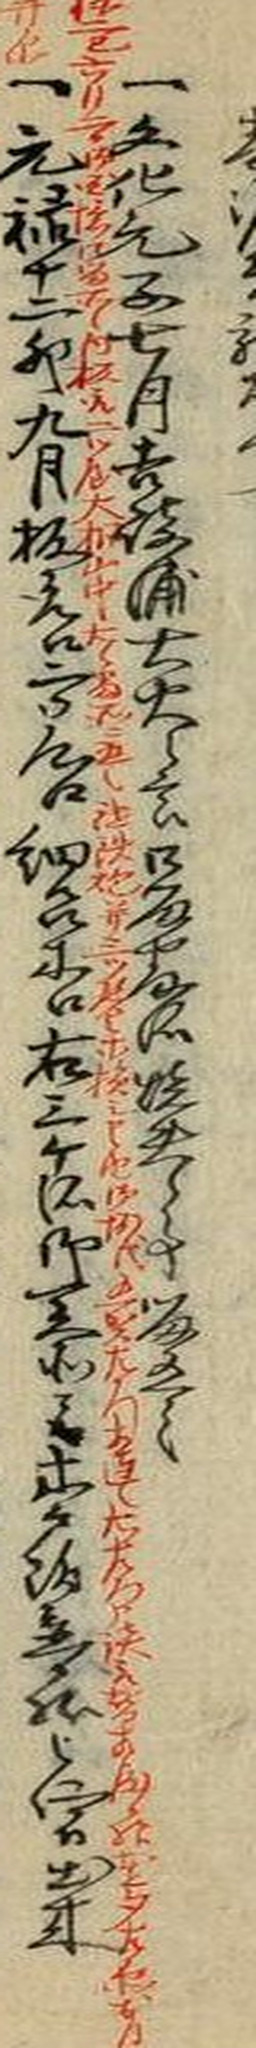一元禄十二卯九月板取口二ツ屋口細呂木口右三ケ所御関所ニ而木戸附置候様被仰付出来
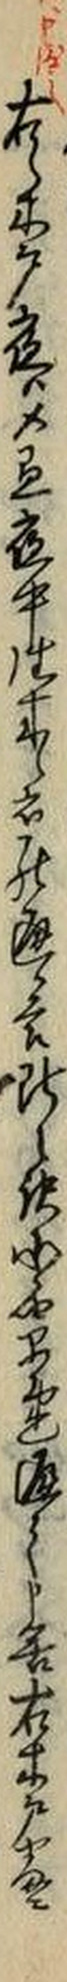右之木戸夜ハ〆置夜中往来之者罷通候節断之訳承届早速通之申筈右木戸番ニ
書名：御国他国諸事之部
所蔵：福井県文書館 Fukui Prefectural Archives
